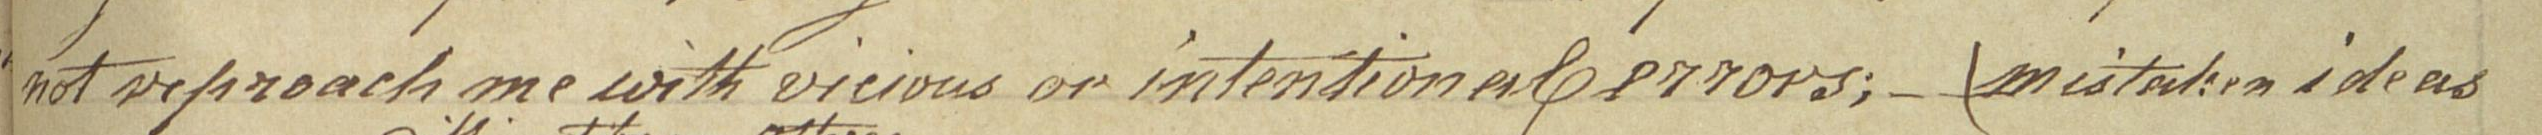not reproach me with vicious or intentional errors; (mistaken ideas
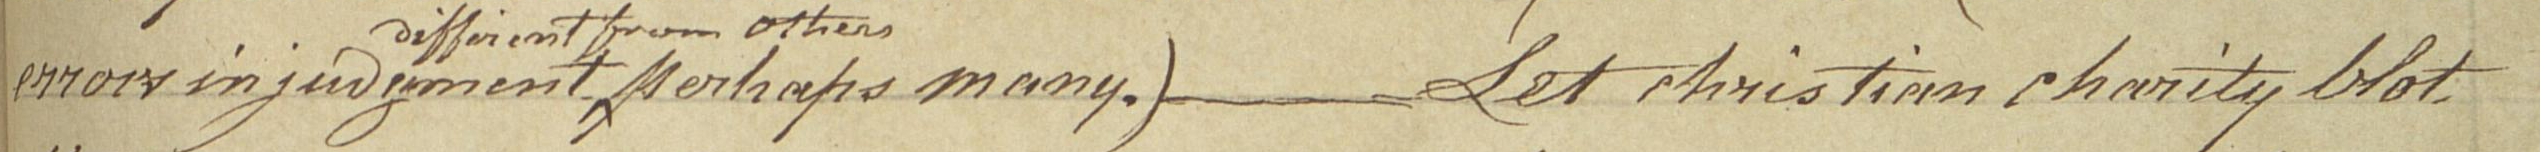errors injudgment ^ perhaps many.) Let christian charity blot
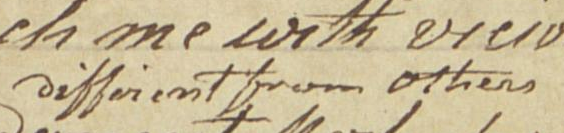different from others
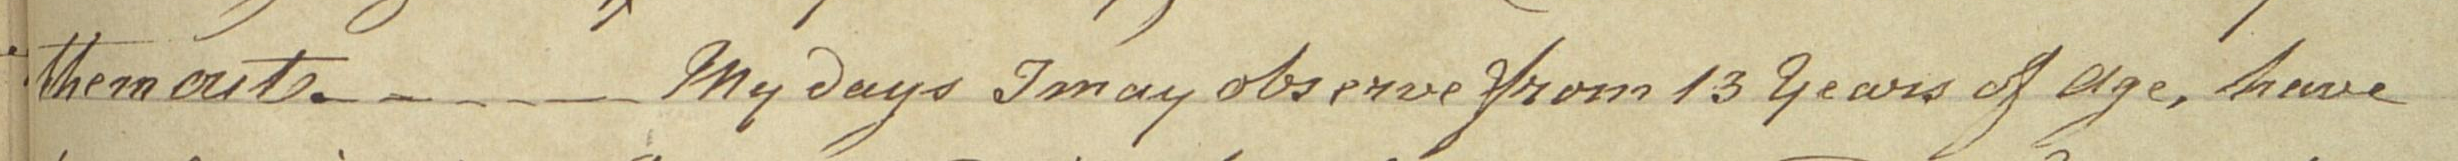them out. My days I may observe from 13 Years of age, have
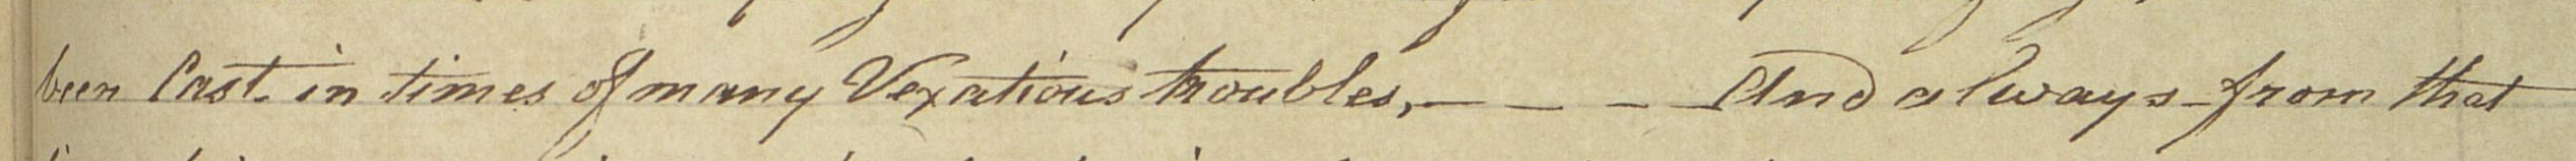been Cast in times of many Vexations troubles, And always from that
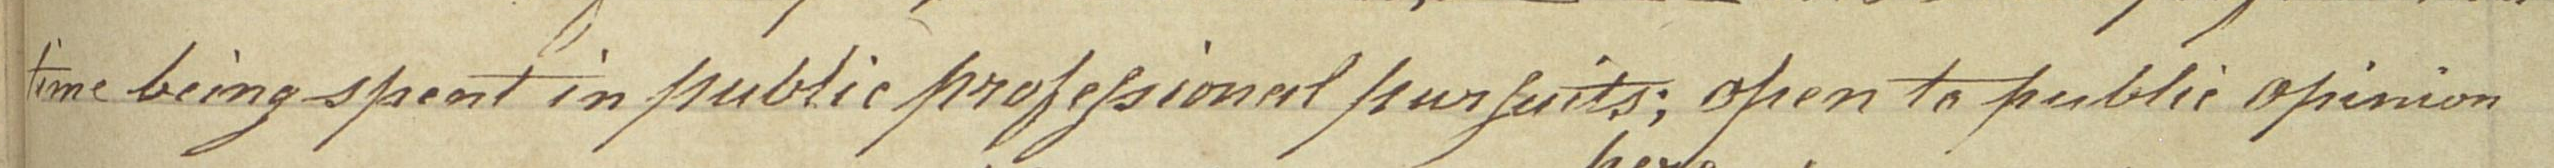time being spent in public professional pursuits; open to public opinion
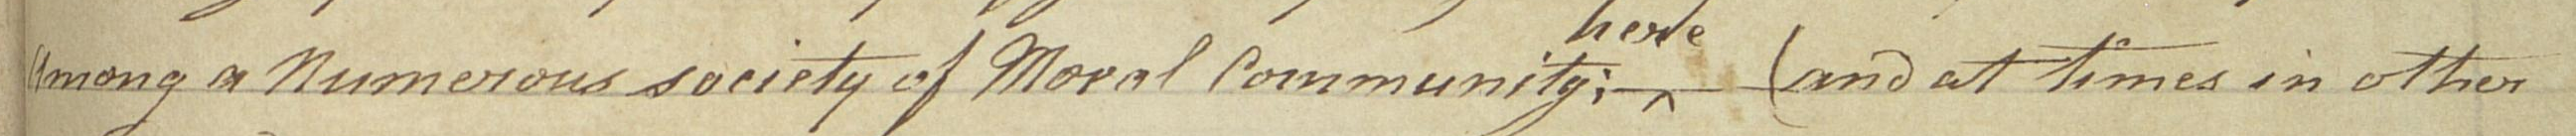Among a Numerous society of Moral Community;- ^ (and at times in other
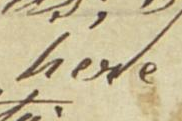here
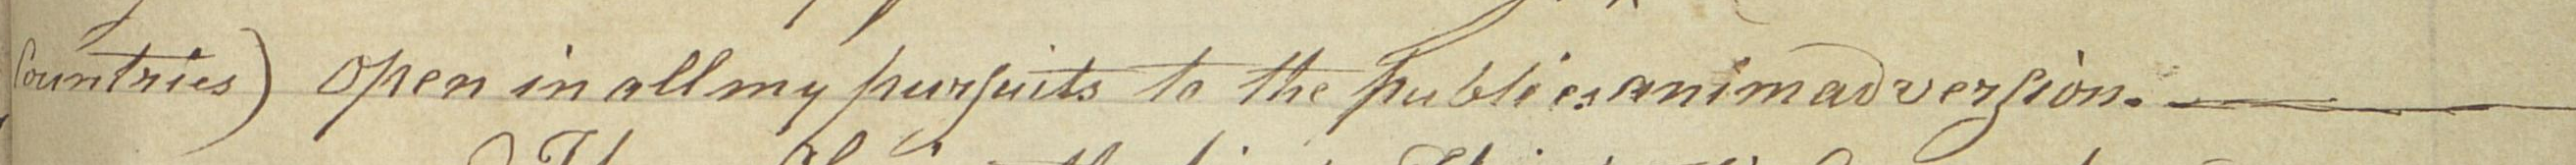Countries) open in all my pursuits to the publics animadversion.
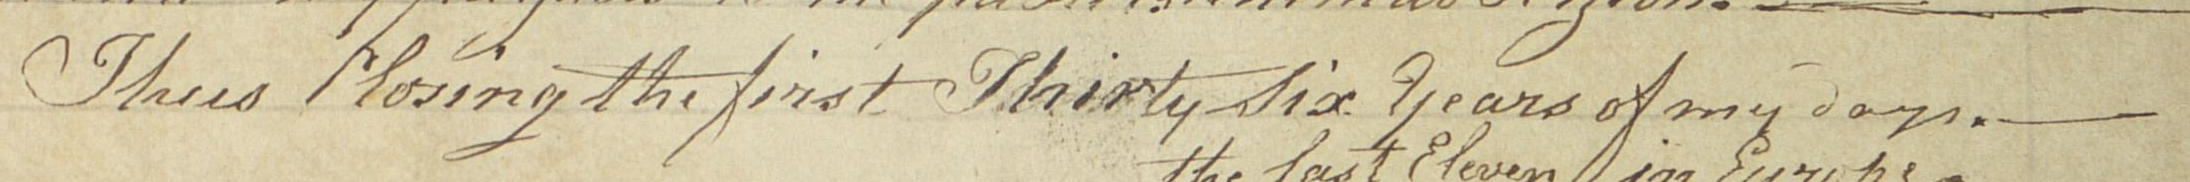Thus Closing the first Thirty Six Years of my days.
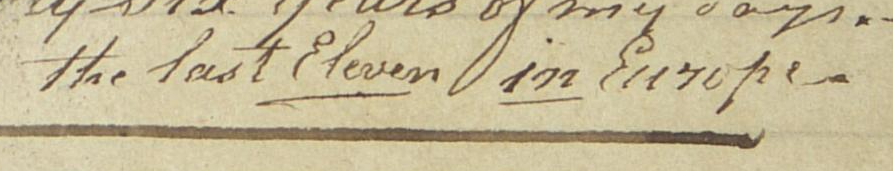the last Eleven in Europe
